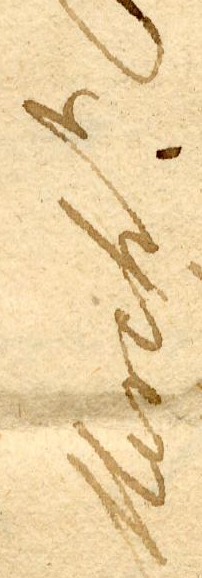Merch^t
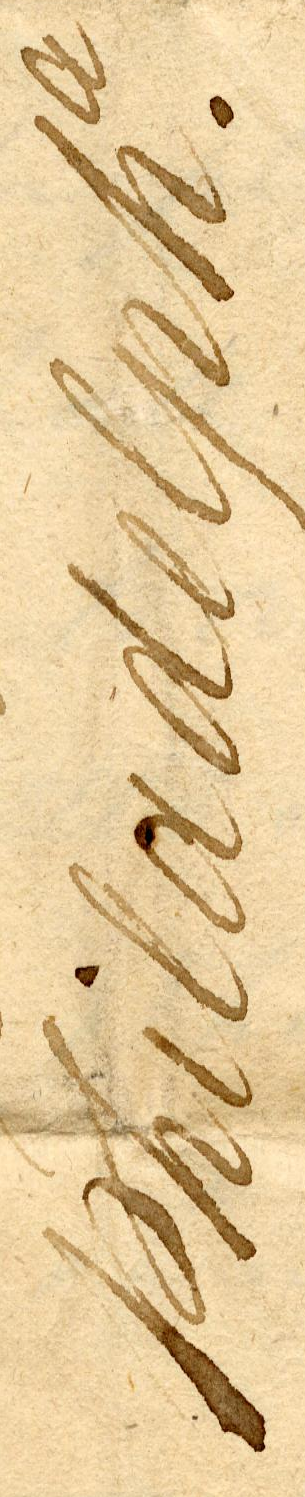Philadelph^a.
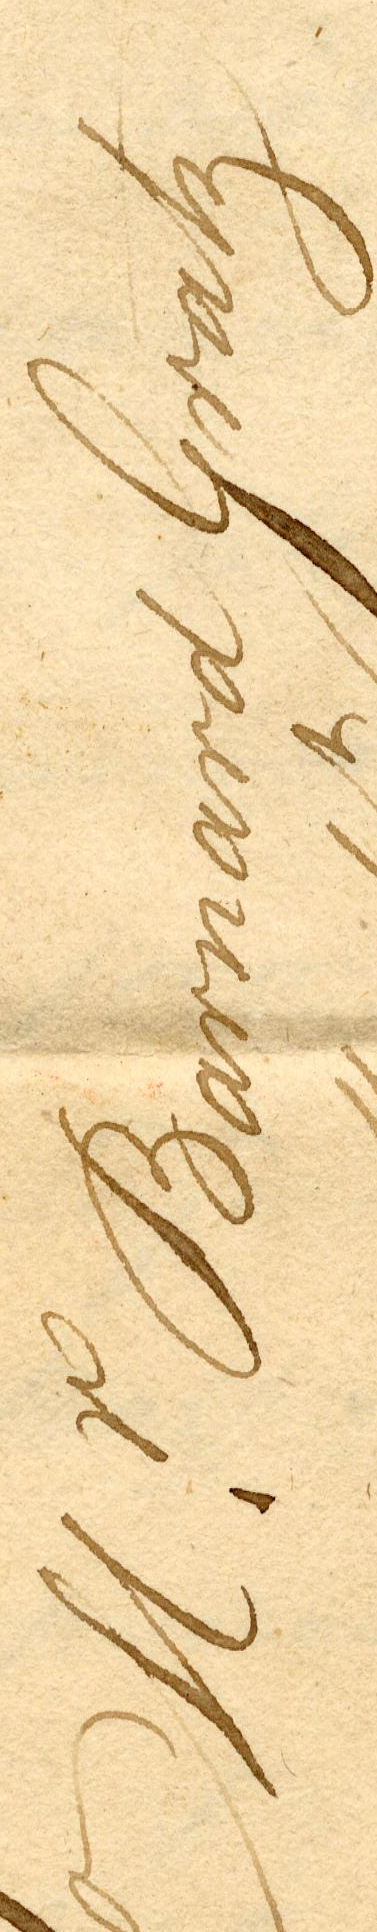M^r. Barnard Gratz
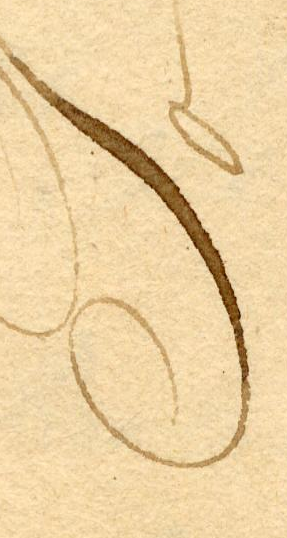To
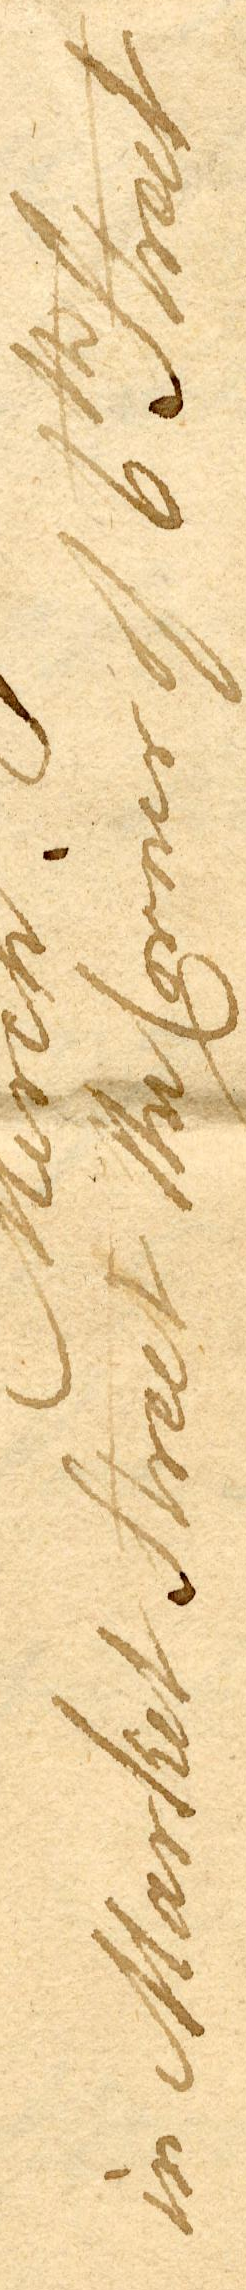in Market Street the Corner of 6^th Street
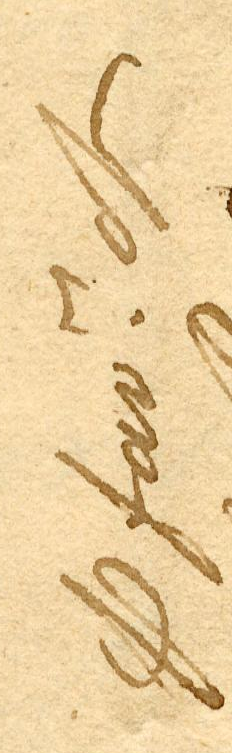per fav^r. of
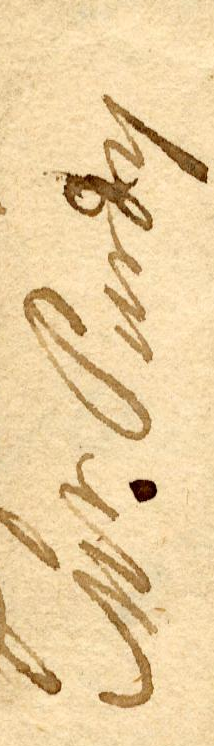M^r Purdy
